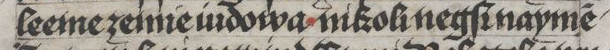leeme zemie iudowa.nikoli negſi naymíe¬
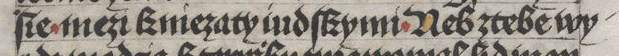ẛie.mezi kniezaty iudſkymi. Neb ztebe wy¬
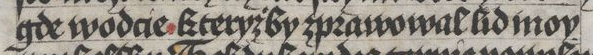gde wodcie.kteryż by zprawowal lid moy
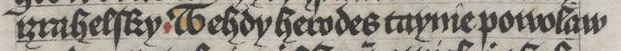izrahelſky.Tehdy herodes taynie powolaw
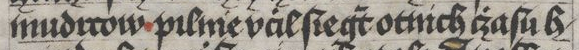mudrrow.pilnie uċil ſie ḡt otních cżaſu h¬
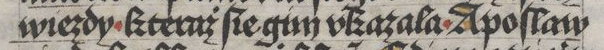wiezdy.kteraż ſie gim vkazala.Apoſlaw
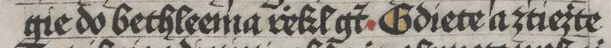gie do bethleema ṙekl ḡt.Gdíete a ztieżte
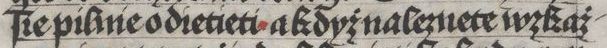ſie pilnie o dietieti.akdyż naleznete wzkaż¬
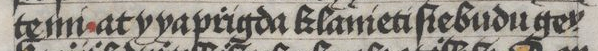te mi.at y ya pṙígda klaníeti ſie budu gev
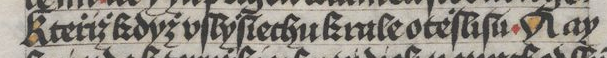Kteṙíż kdyż vſlyẛiechu krale oteẛli ſu.A ay
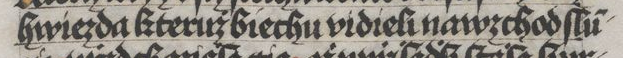hwiezda kteruż biechu vidieli nawzchod ſlū¬
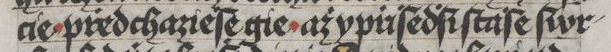cie.pṙedchazieẛe gie.aż y pṙiẛedẛi ſtaẛe ſwr¬
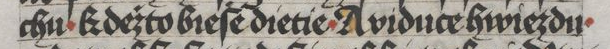chu.kdeżto bieẛe díetie.A viduce hwiezdu.
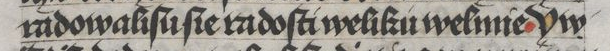radowaliſu ſie radoſtí welikú welmie.Y w¬
